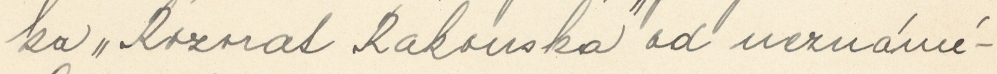ka „Rozvrat Rakouska“ od neznámé-
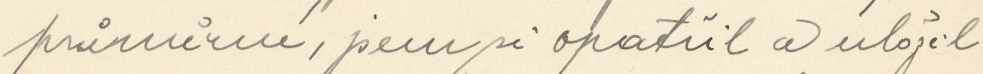průměrné, jsem si opatřil a uložil
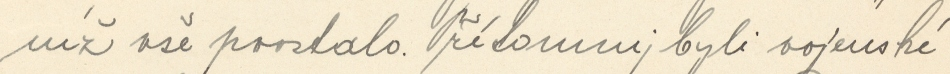níž vše povstalo. Přítomni byli vojenské
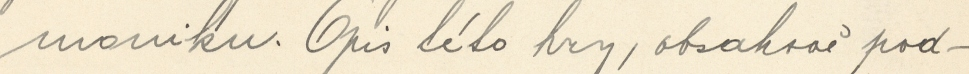moniku. Opis této hry, obsahově pod-
